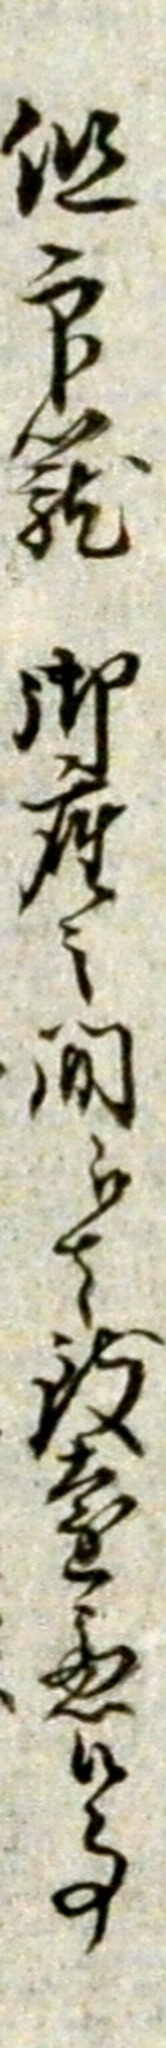但印籠御座之間江者致遠慮候事
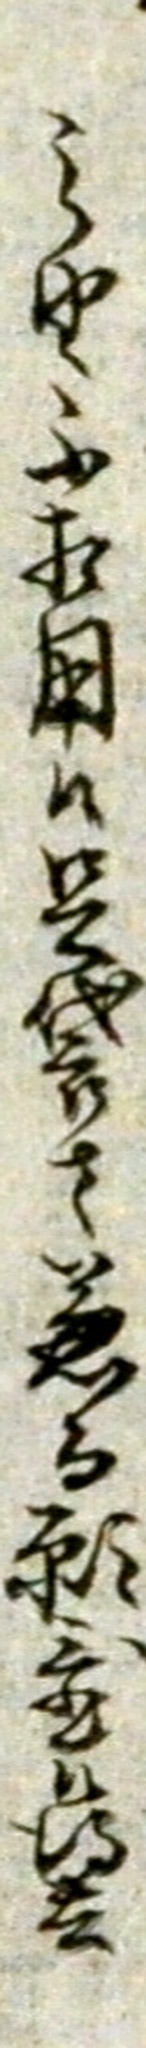之由不相用候足袋者兼而願置候得共
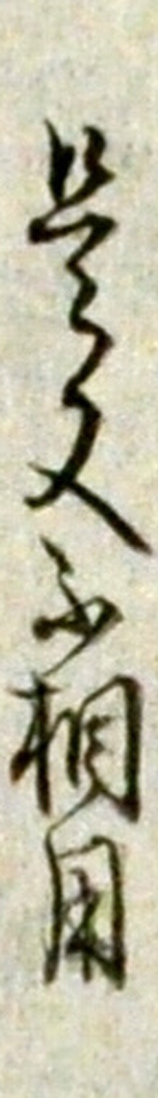是又不相用

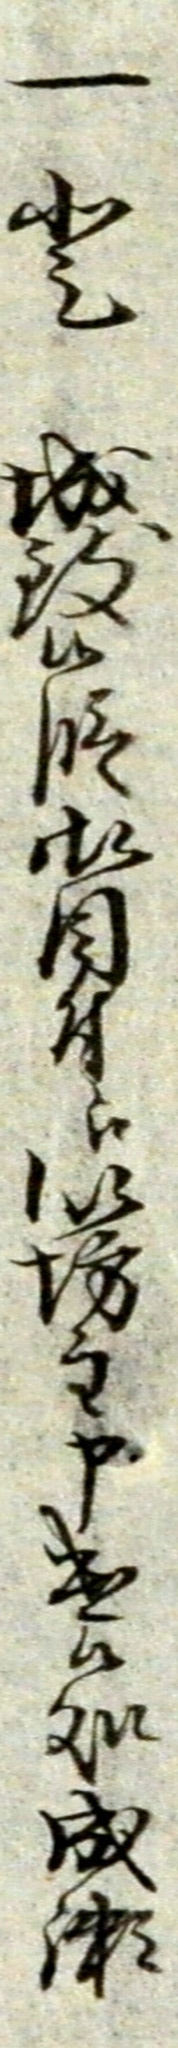一登城致候段御目付江以坊主申遣候処成瀬
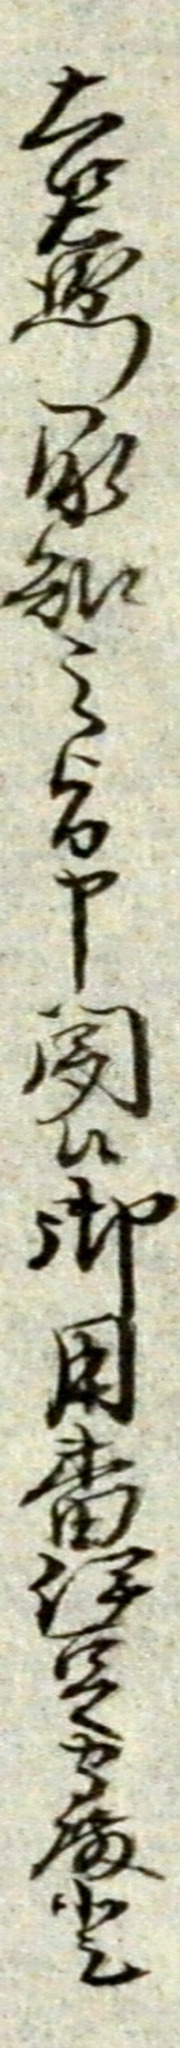吉右衛門承知之旨申聞候御用番伊豆守殿登
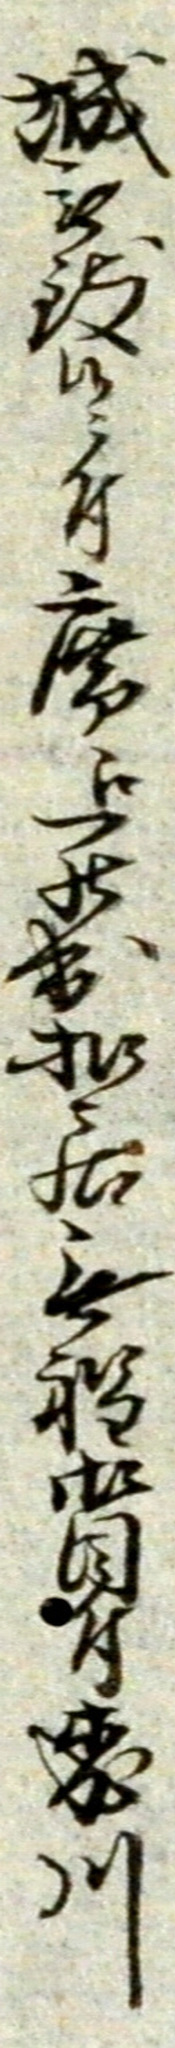城被致候ニ付席江罷出扣居無程御目付森川
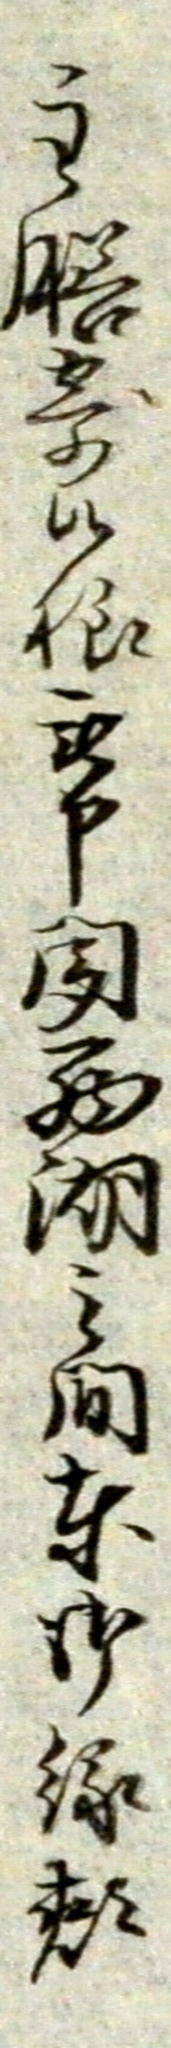主膳寄候様被申聞西湖之間東御縁頬
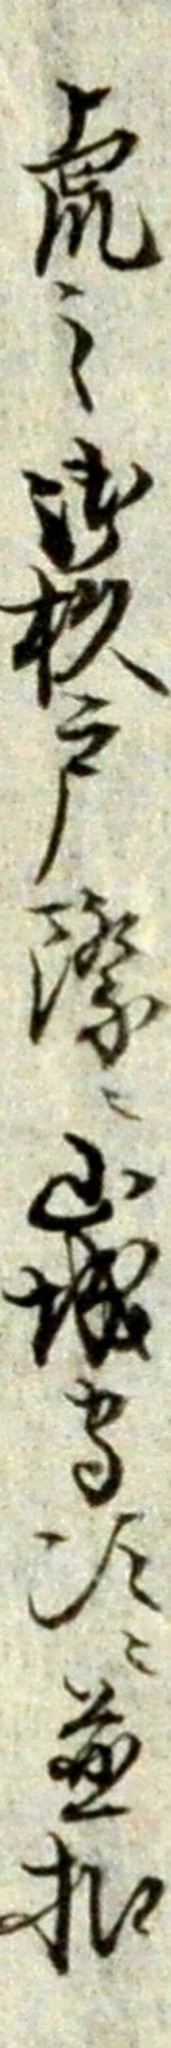虎之御杉戸際ニ山城守次ニ並扣
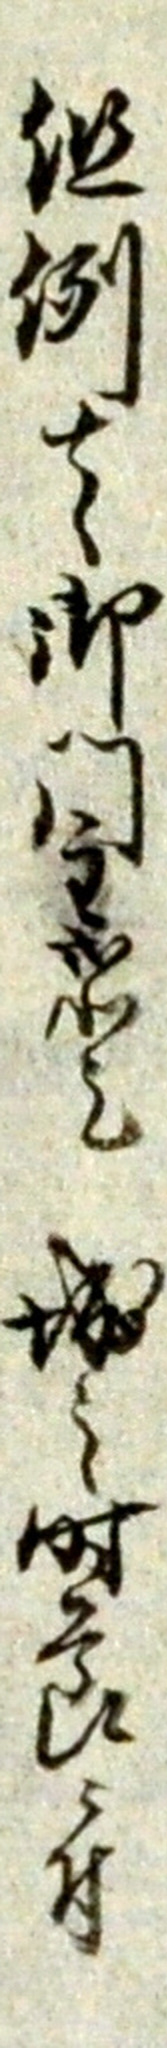但例者御門主御登城之時節ニ付
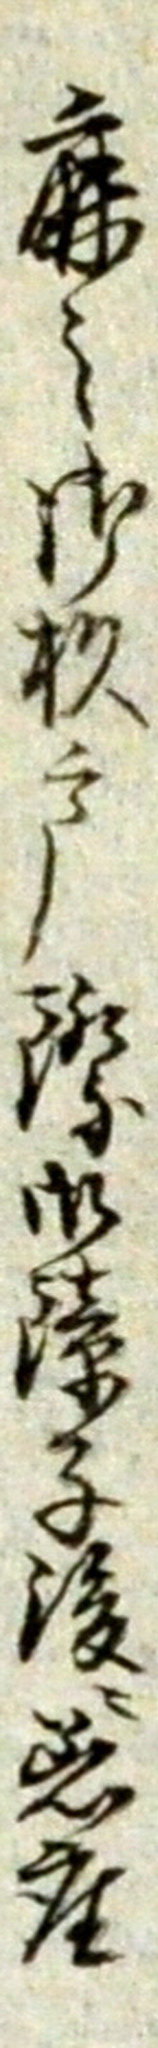鹿之御杉戸際御障子後ニ着座
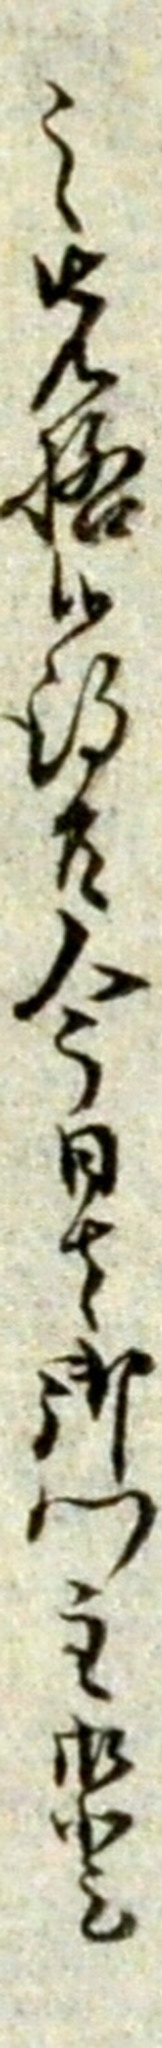之先格候得共今日者御門主御登
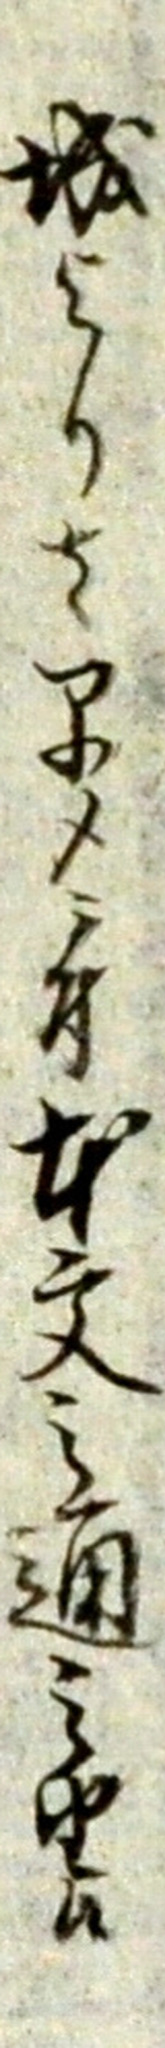城より者早メニ付本文之通之由候
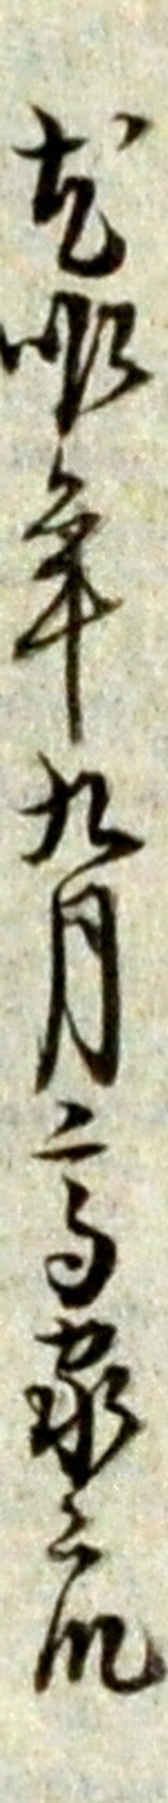尤昨年九月高家衆
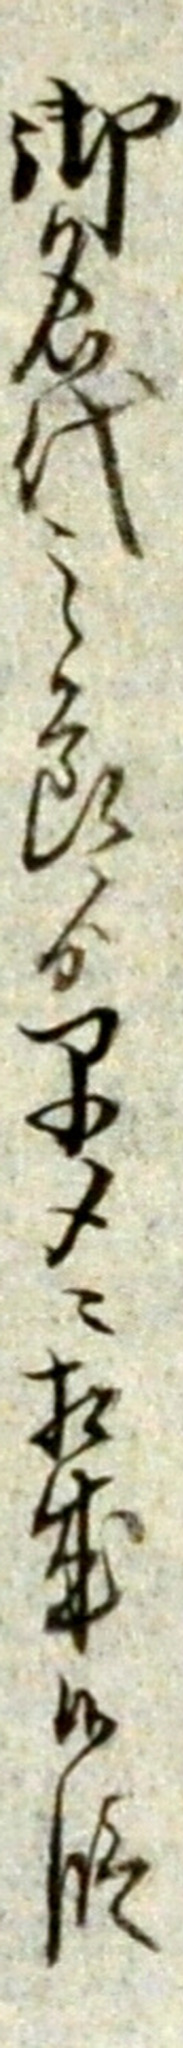御名代之節ゟ早メニ相成候段
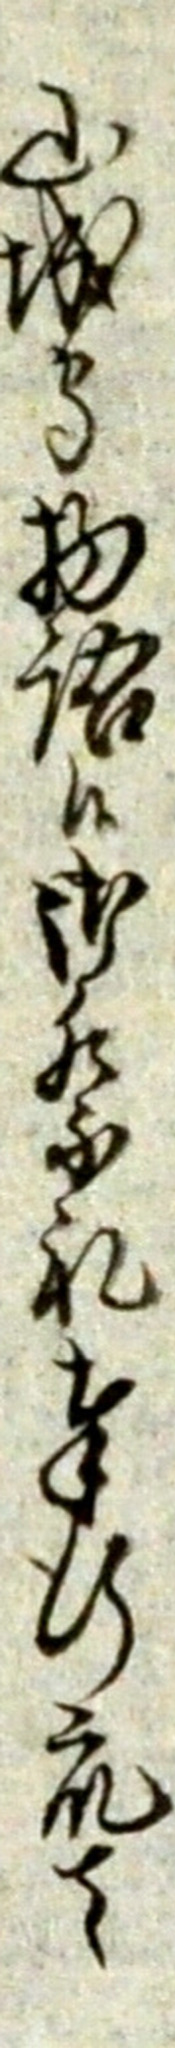山城守物語候御祭礼奉行衆者
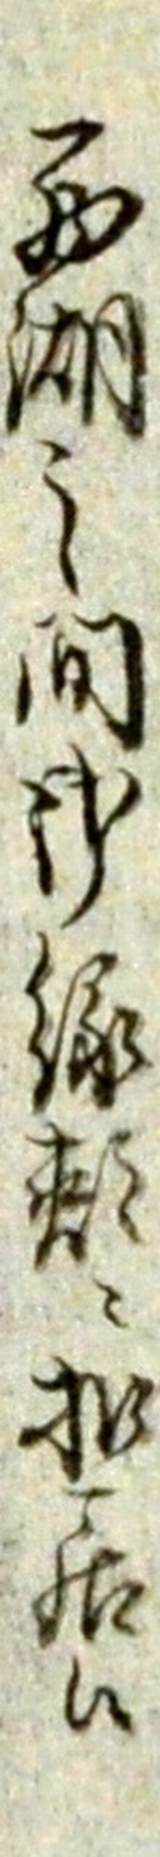西湖之間御縁頬ニ扣居候
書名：日光御名代相勤候節ノ留
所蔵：伊那市立高遠町図書館・合同会社AMANE
